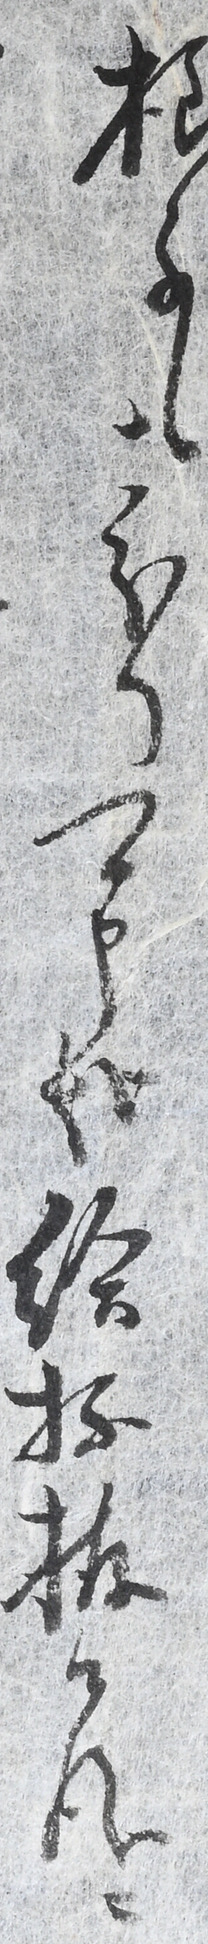様子も分り可申哉給杯拵候様ニ
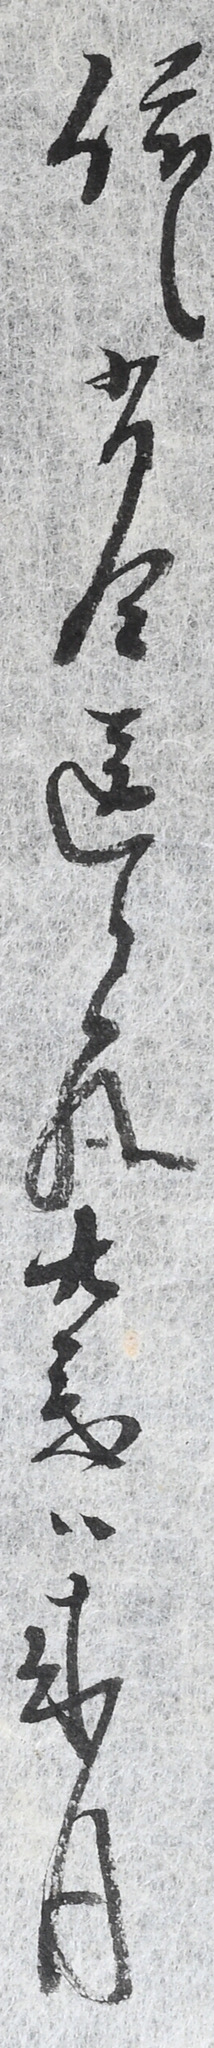依之有合送り候様此義ハ来月
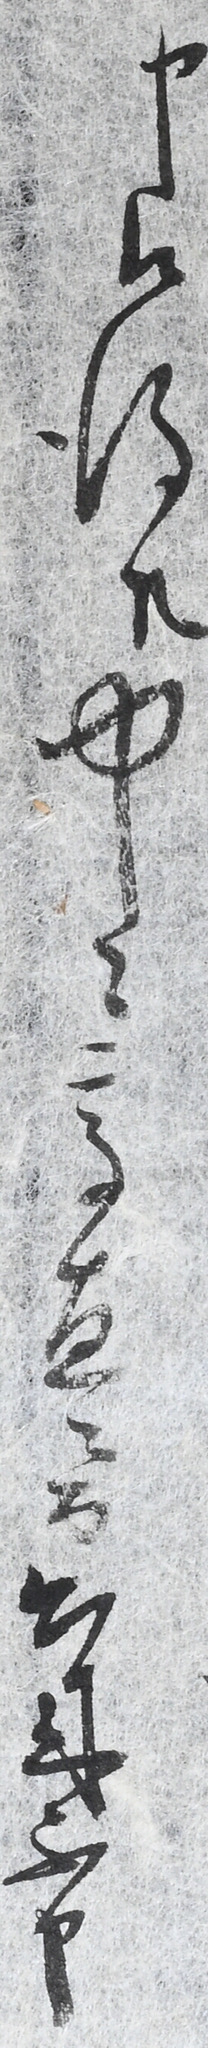申候得共中々高直ニ而出来不申
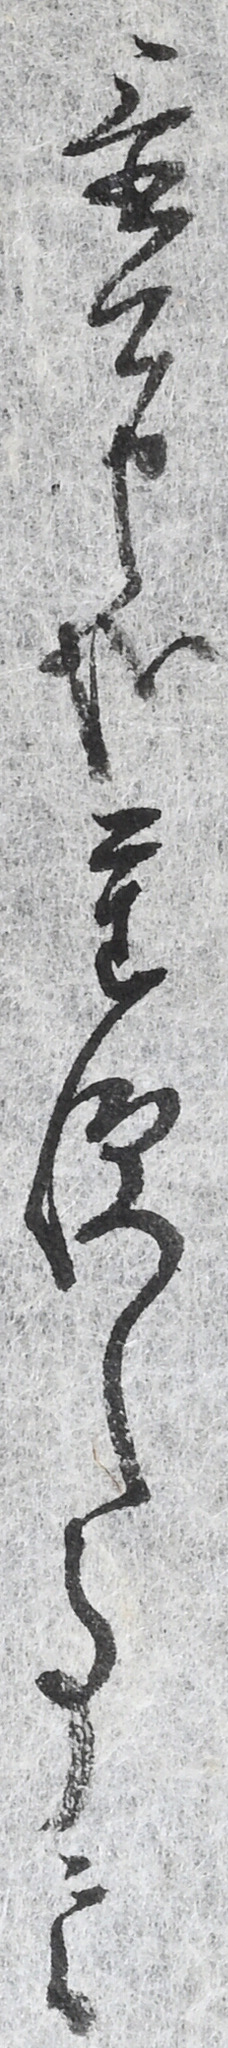置可申哉重便之事ニ候
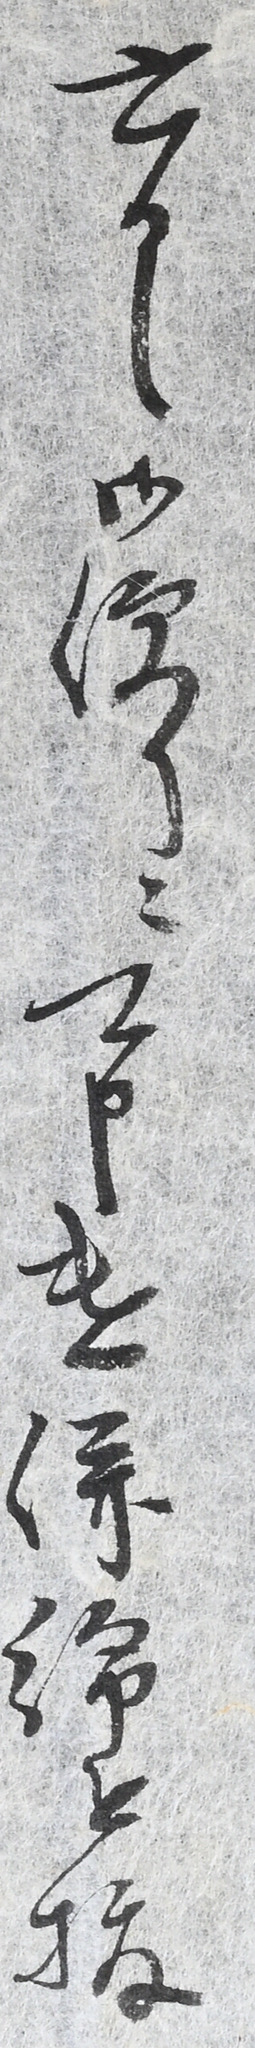六日之御便りニ可申遣併綿を抜
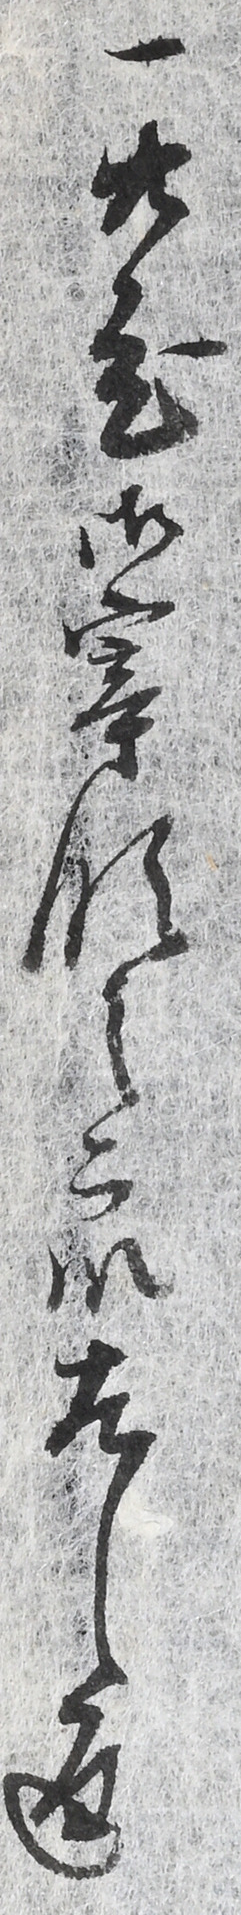一此尤御宰領之衆左之通
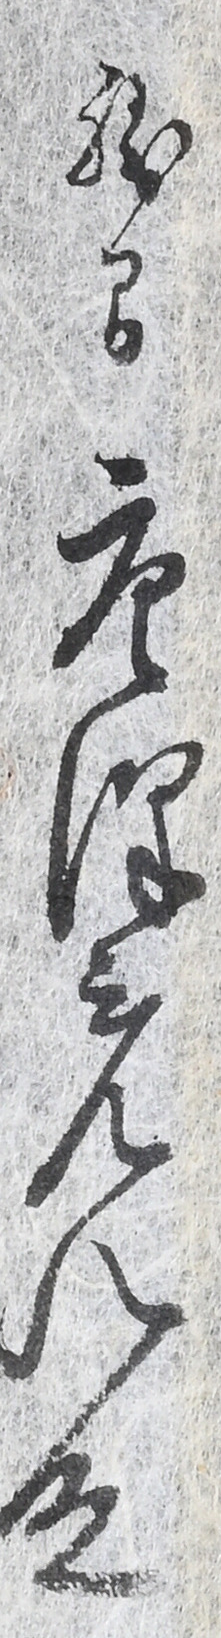勝間唐澤充八殿
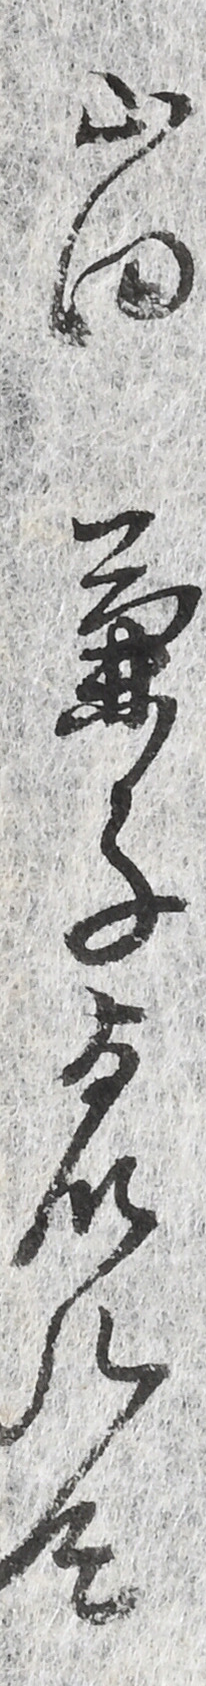山田兼子恵八殿
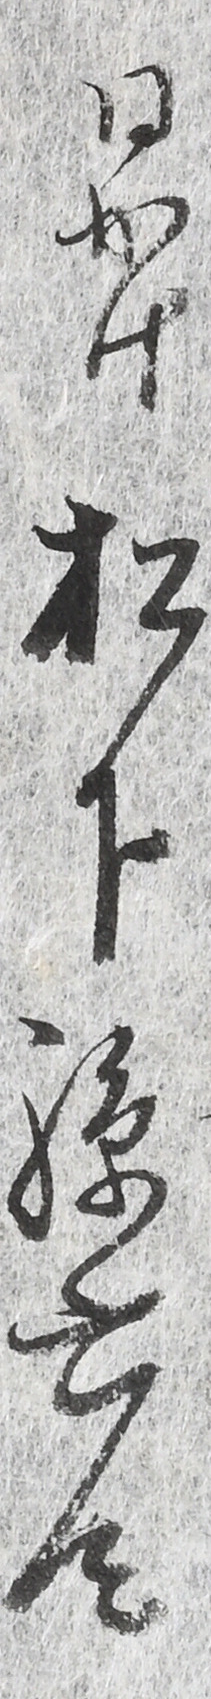日かげ松下孫六殿
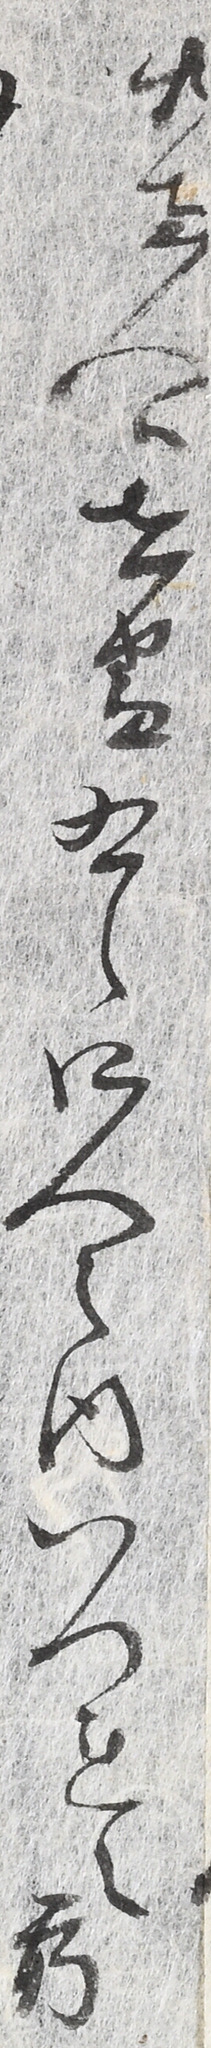此両人ハ在番右之四人之内いつれ之方
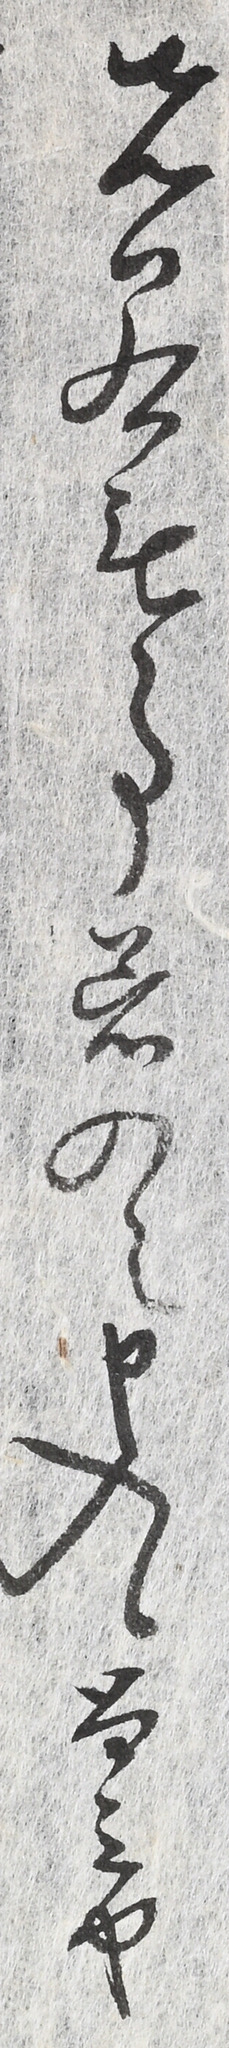先日右無事着のミ申入候留主中
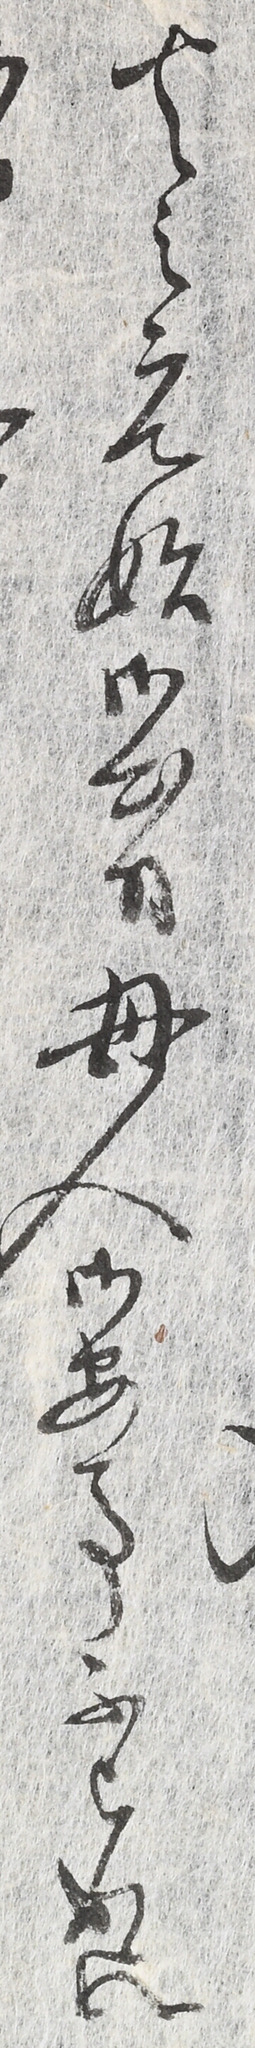火之元始御心付母人御安事不被成候様
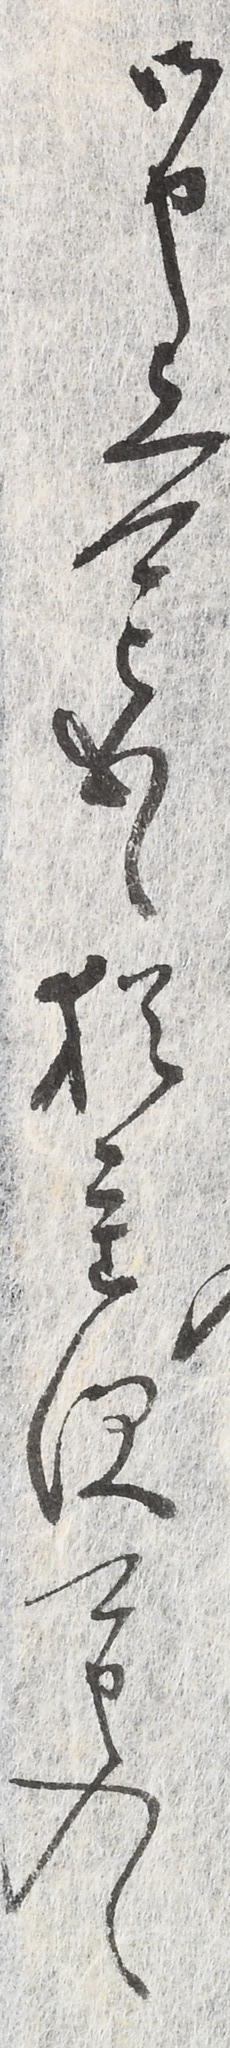御申上可被成候猶重便可申入候
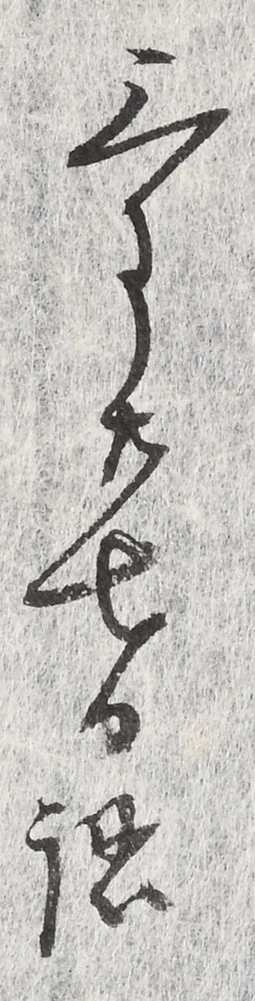三月廿七日認
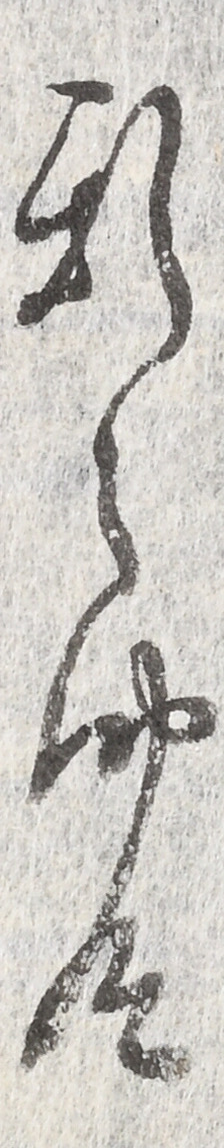新之助殿
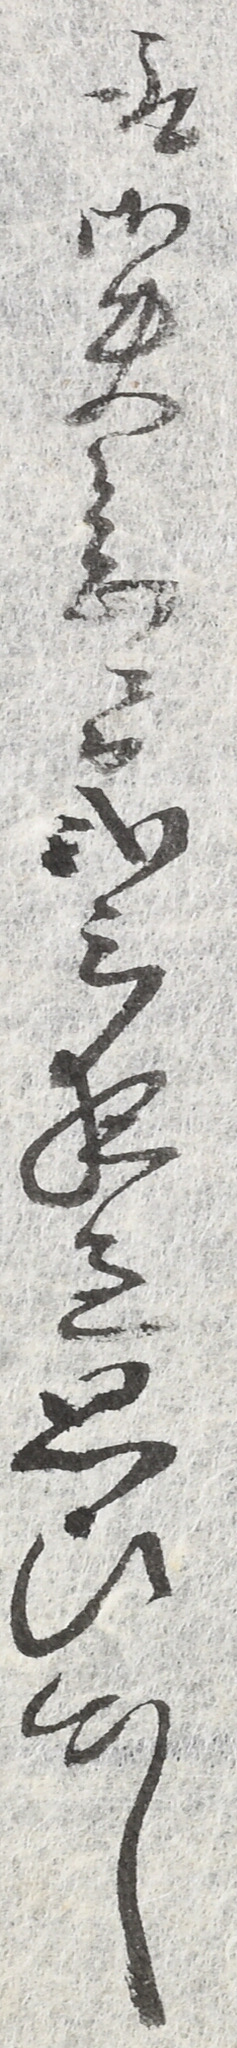取御失念ニ而弐三夜過思ひ出し
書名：（書状）
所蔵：伊那市立高遠町図書館・合同会社AMANE
